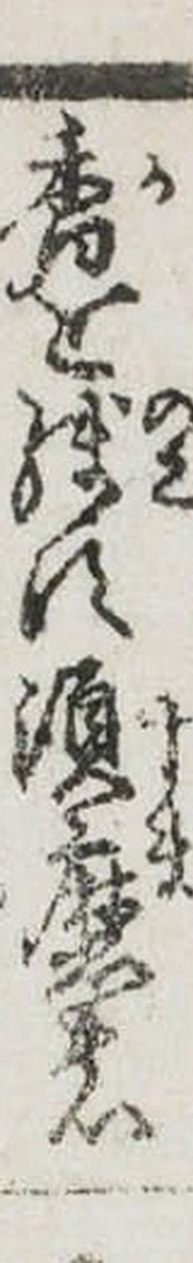香を残す須磨の
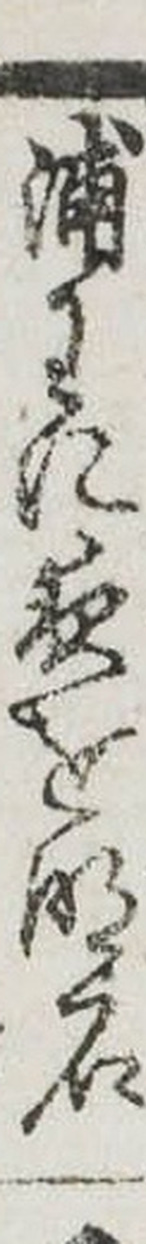浦わに夜を明石
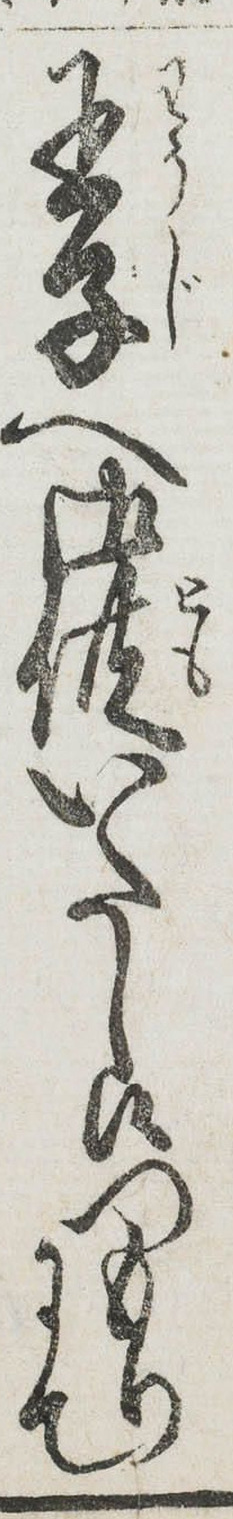王子へ御供いたし候つもりにて
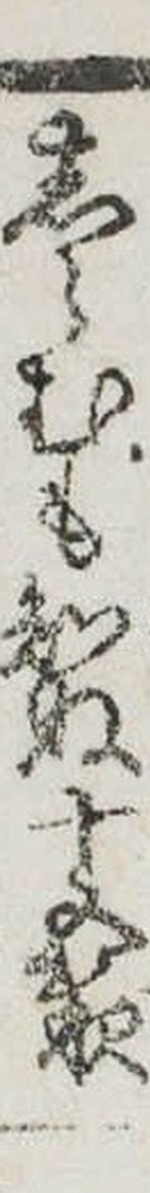しらむも知ぬ十五夜
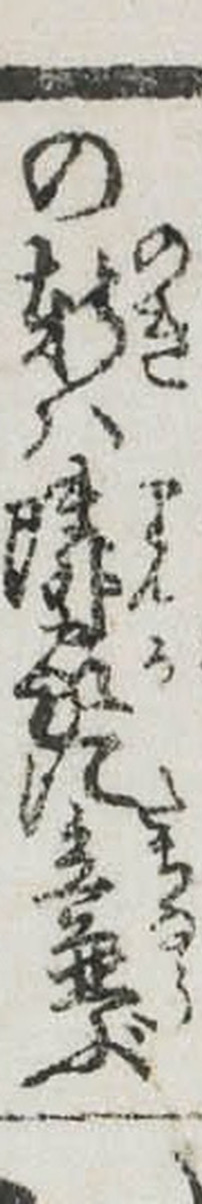の軒は隣家に立並ぶ
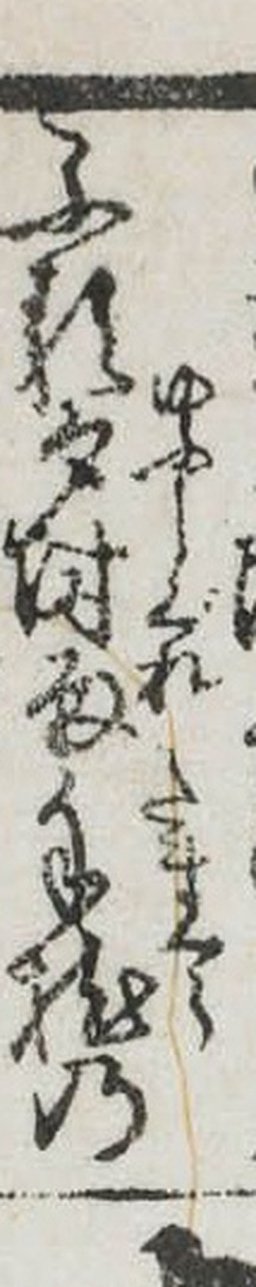ふる夕時雨手枕の
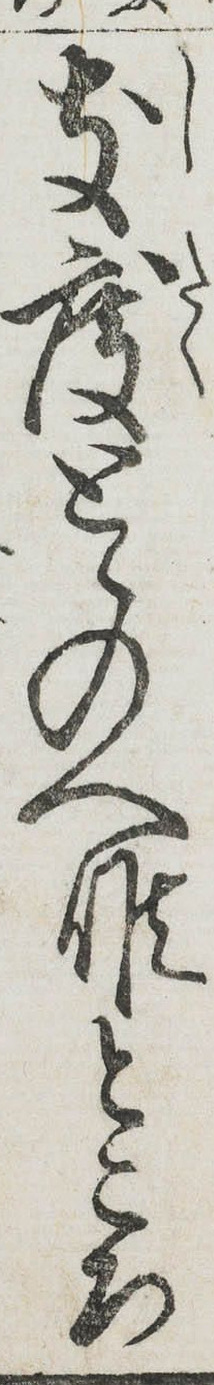支度とゝのへ候ところ
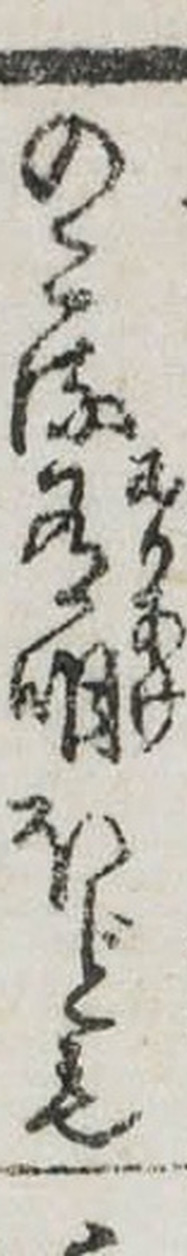のこる有明ほども
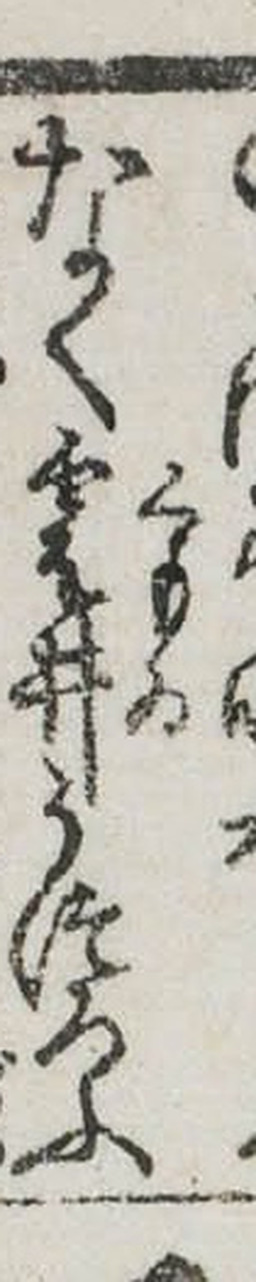なく雲井うつろふ
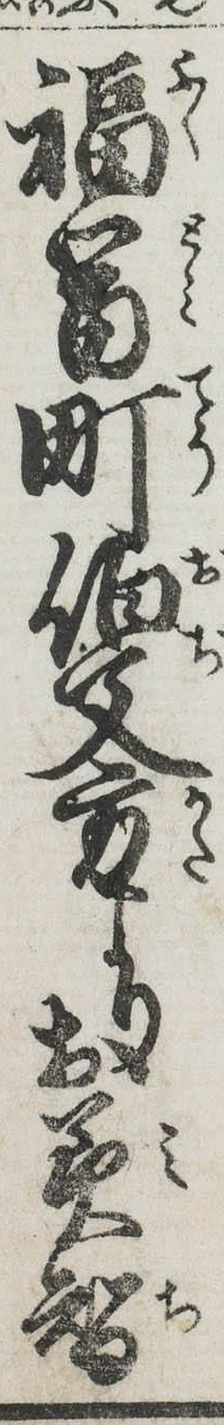福冨町伯父方よりお美智
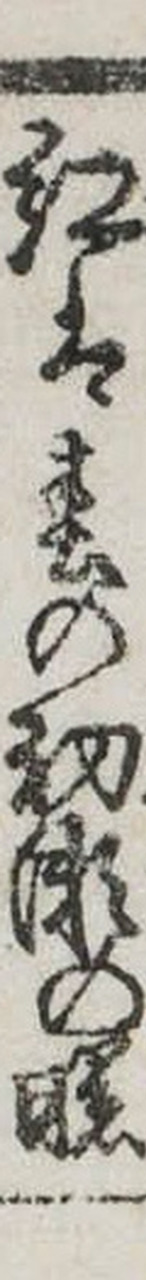紅は春の初瀬の曙
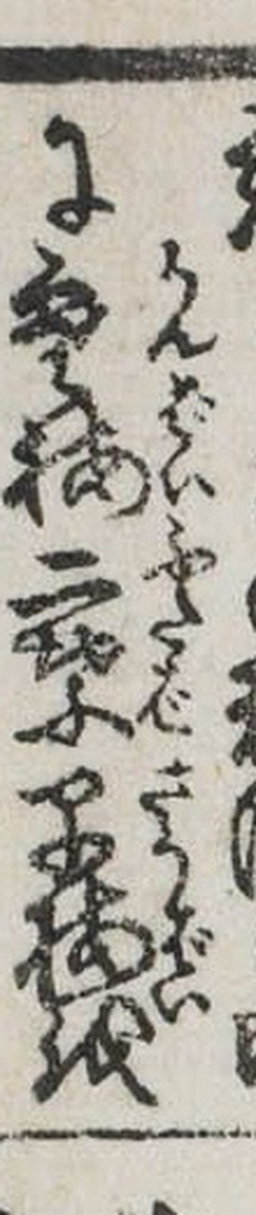に寒梅二葉早梅を
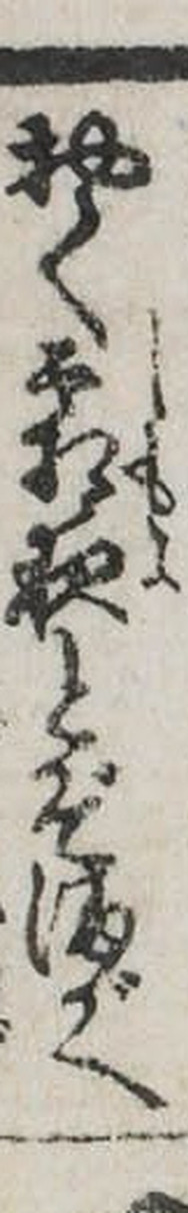おく霜夜とぞまがえ
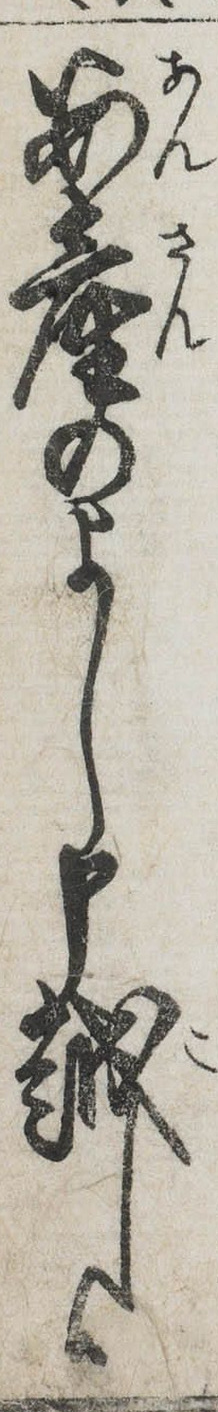安産のよし申越し候
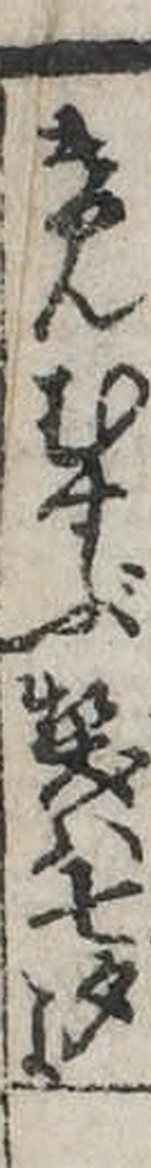けんむすぶ契は七夕よ

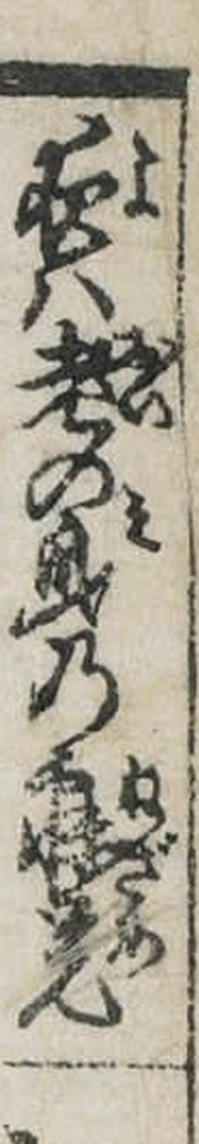夜は老の身の寝覚
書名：頭書萬用婦人手紙之文言
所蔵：東京学芸大学教育コンテンツアーカイブ
